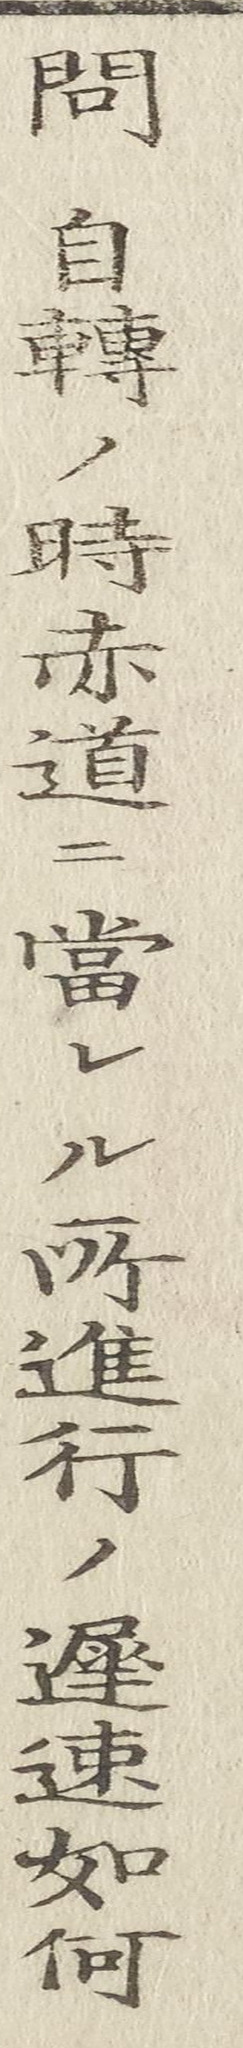問自転ノ時赤道ニ当レル所進行ノ遅速如何
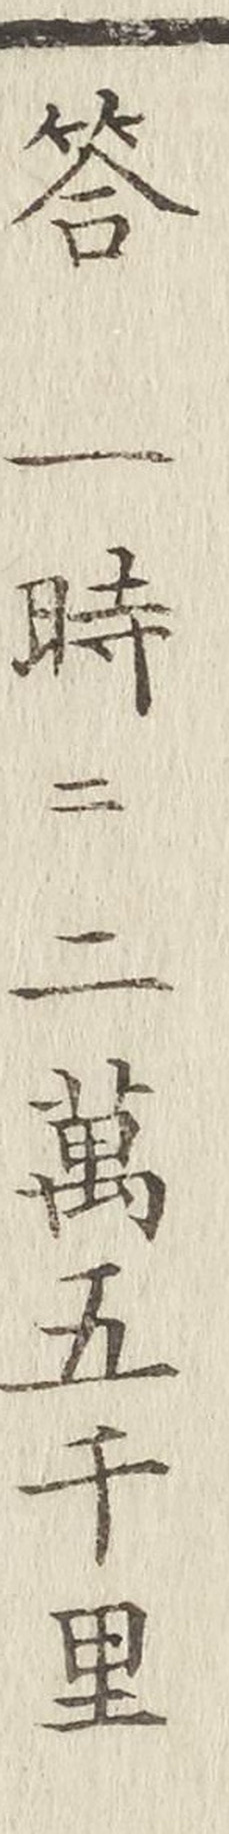答一時ニ二万五千里
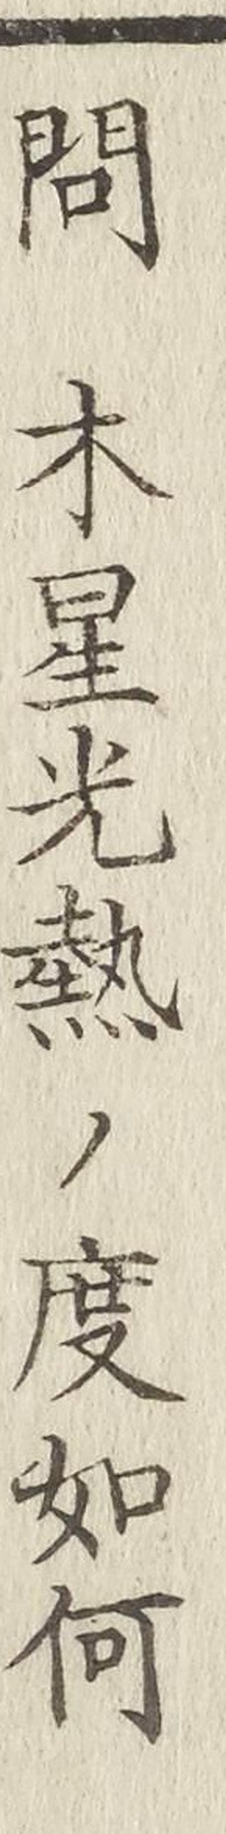問木星光熱ノ度如何
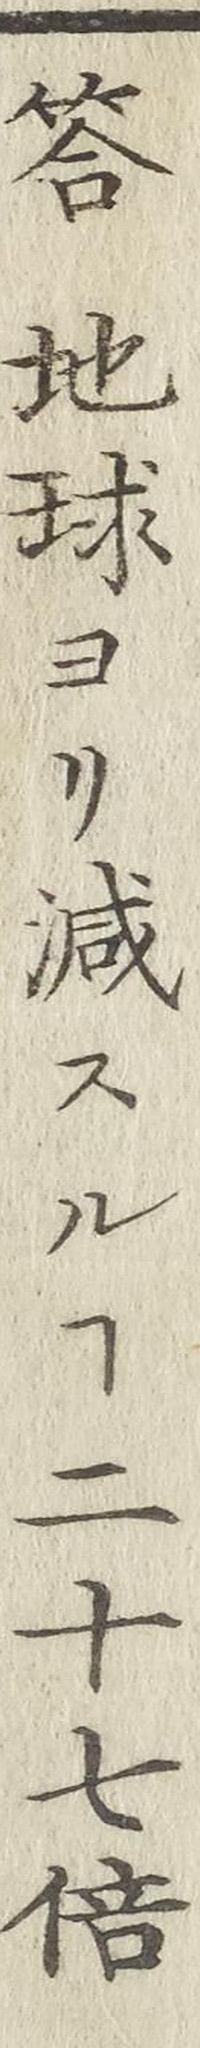答地球ヨリ減スルコト二十七倍

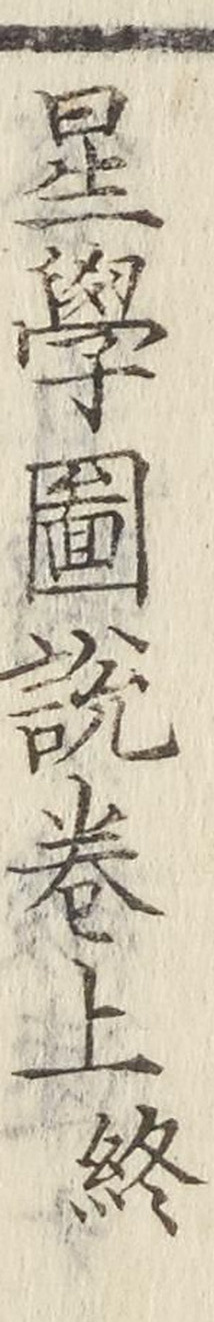星学図説巻上終
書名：星学圖説　上
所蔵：東京大学地震研究所図書室 Earthquake Research Institute Library, The University of Tokyo, JAPAN
